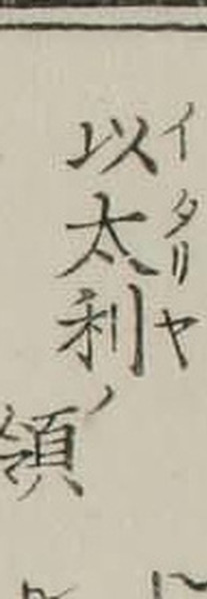以太利ノ領
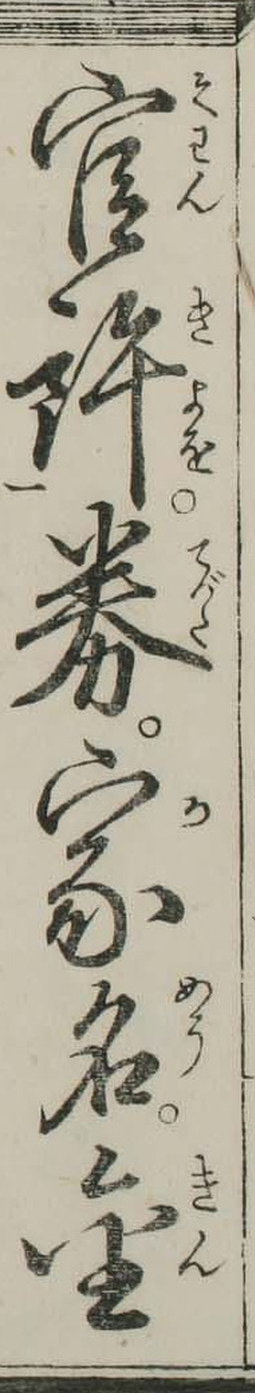官許。券。家名。金
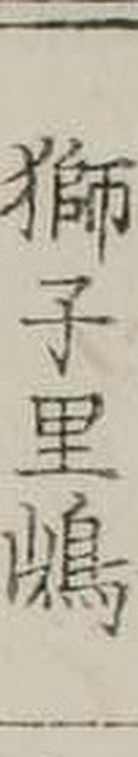獅子里嶋
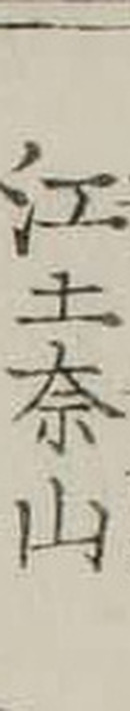江土奈山
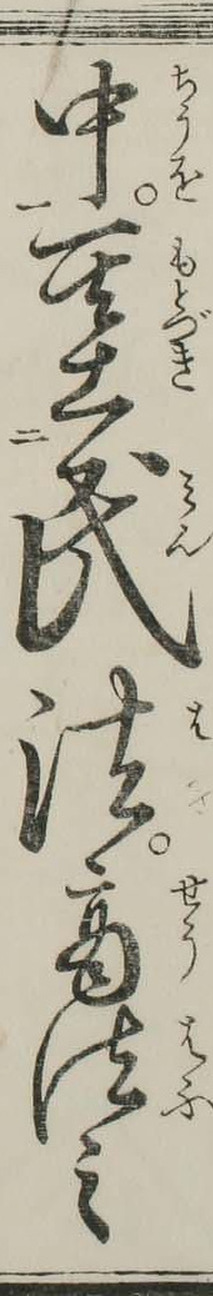中。基民法。商法之
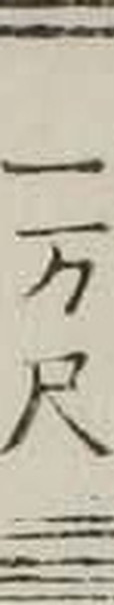一万尺
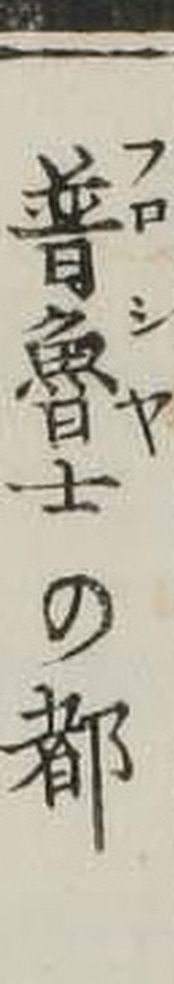普魯士の都
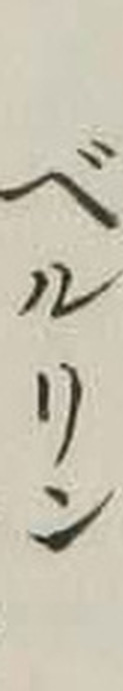ベルリン
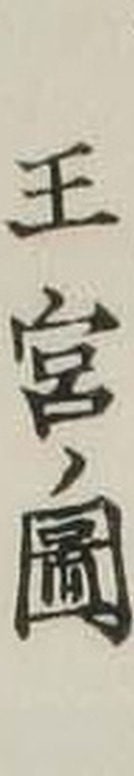王宮ノ図
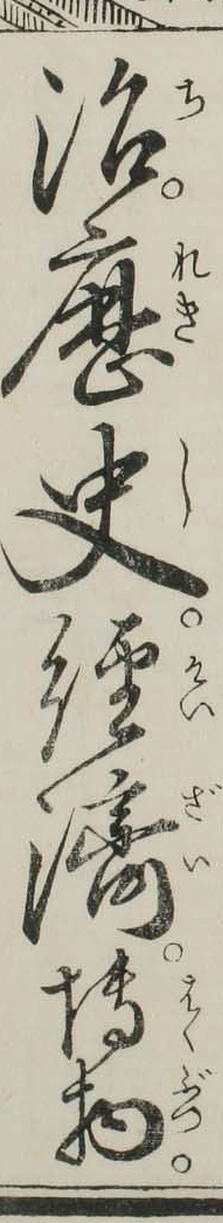治。歴史。経済。博物。
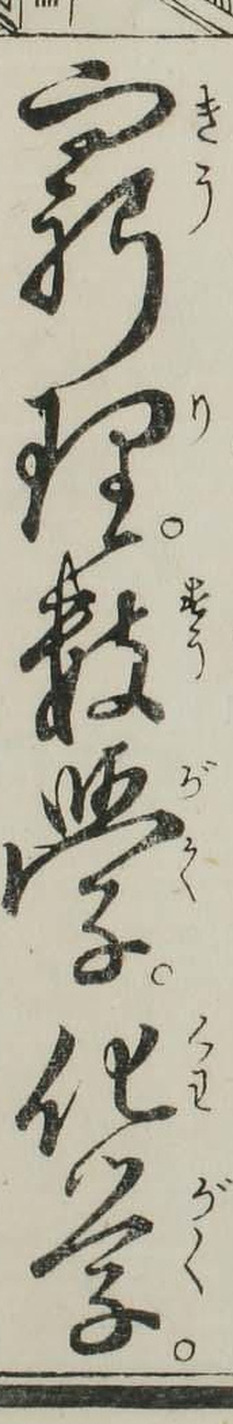窮理。数学。化学。
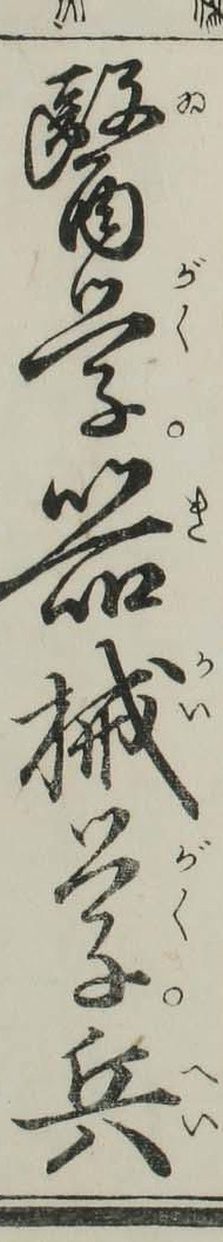医学。器械学。兵

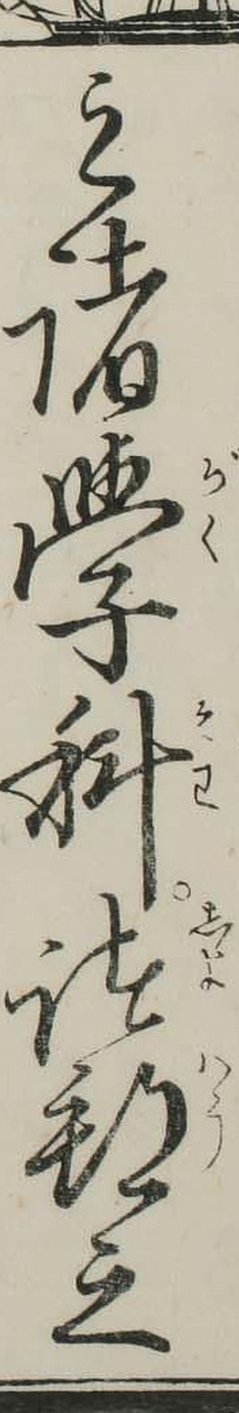之諸学科。諸邦之
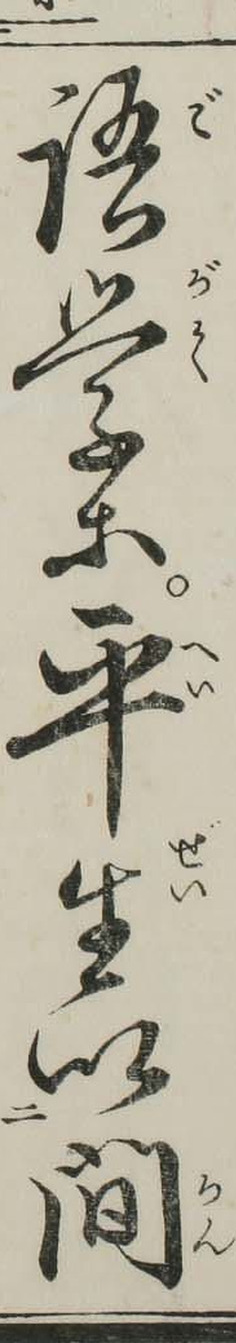語学等。平生以間
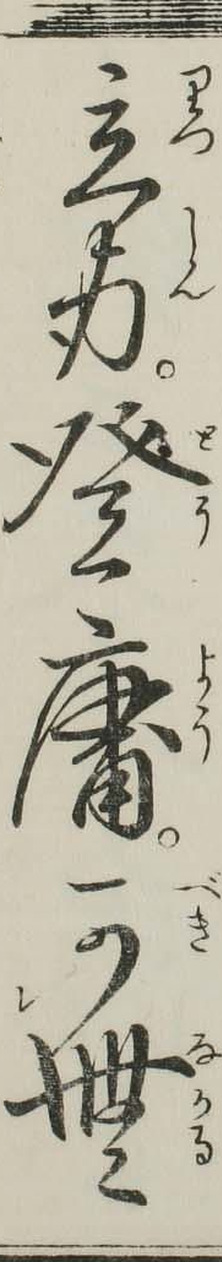立身。登庸。可無
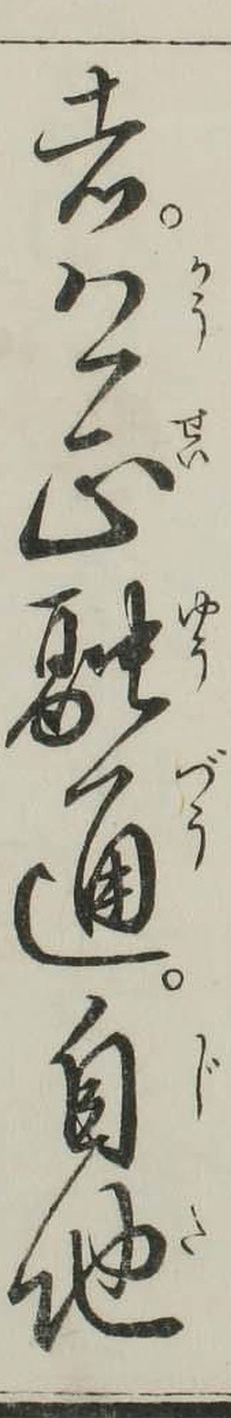は。公正融通。自他
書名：開化往来
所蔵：東京学芸大学教育コンテンツアーカイブ
